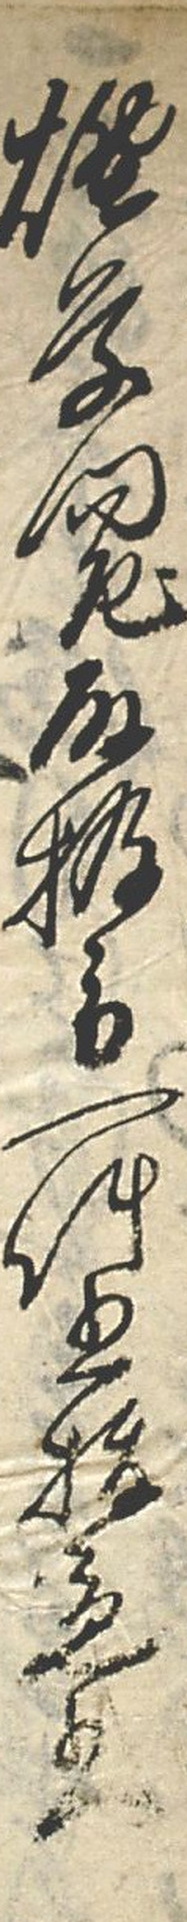煙草問屋取扱方一件書抜覚書
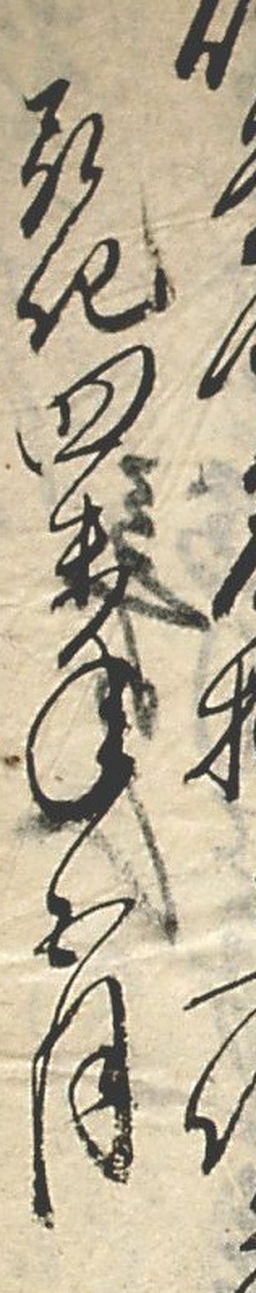弘化四未年五月

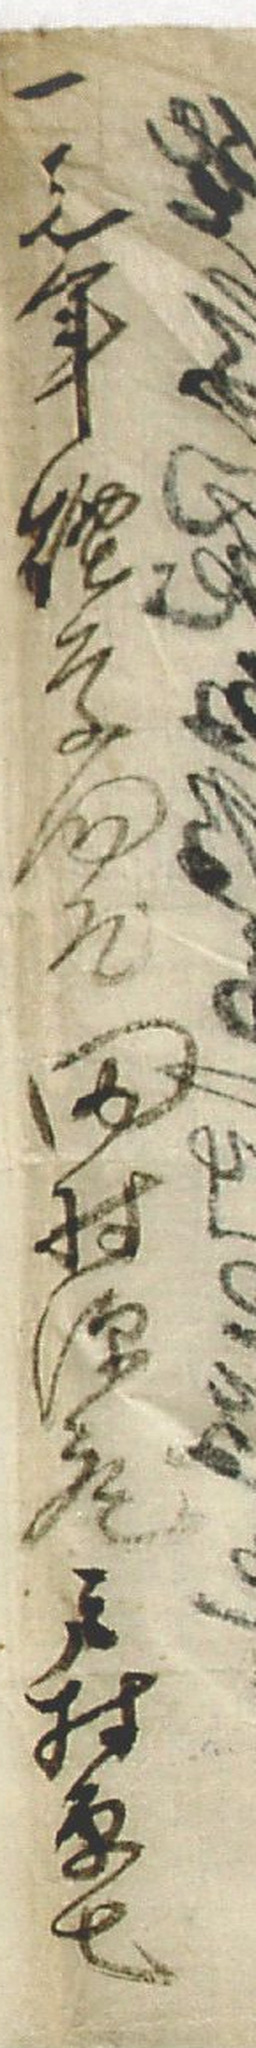一先年煙草問屋田村源蔵戸村平七
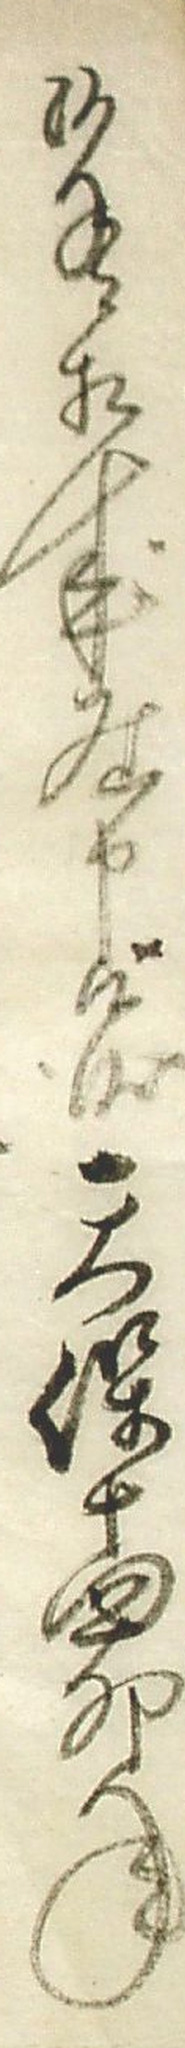弐手に相成居申候所天保十四卯年
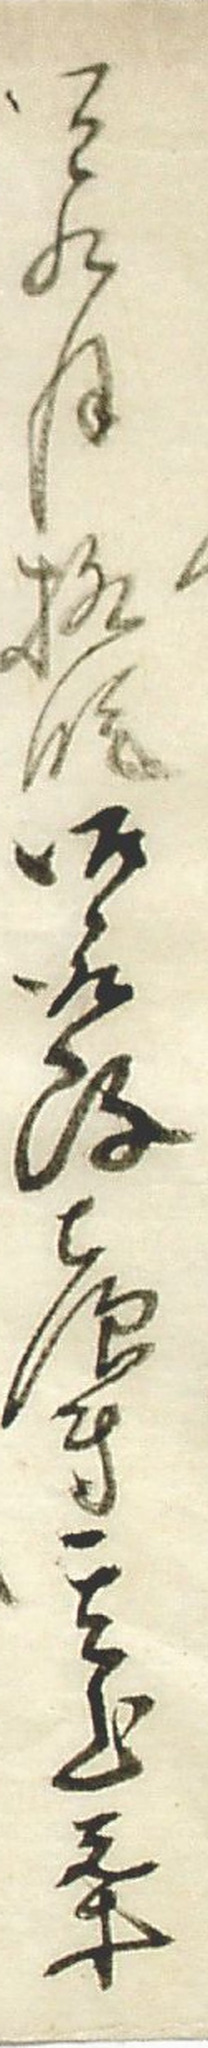閏九月格段御取改被仰付其上元木
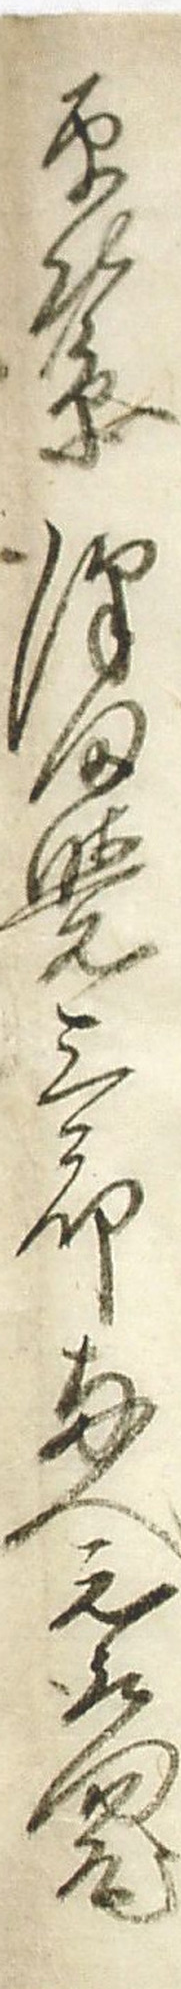平次兵衛沢田覚三郎両人元取問屋
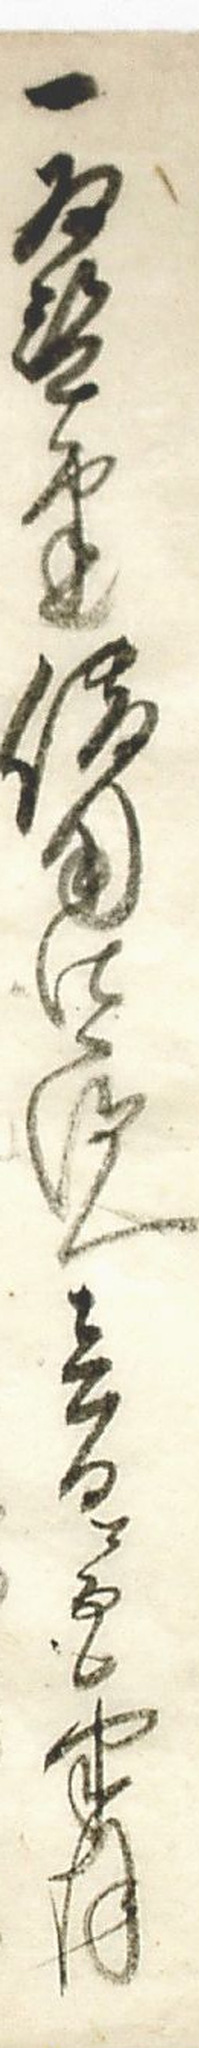一為替金借用仕候得は壱日にても半月
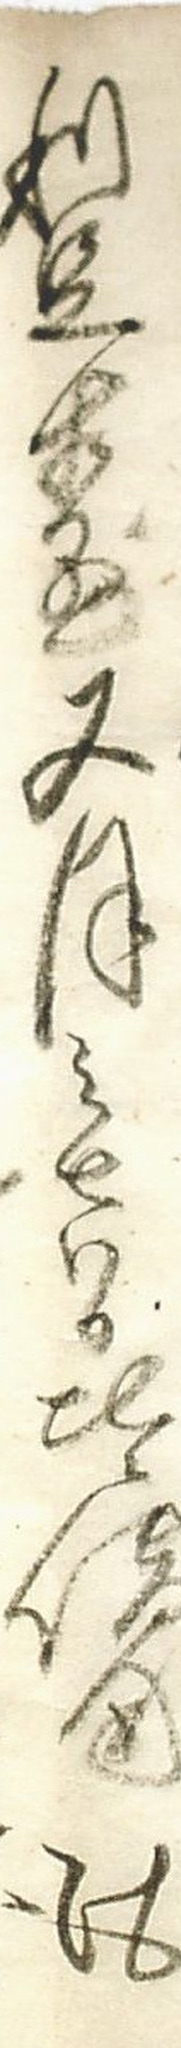利足相懸又月之七八日頃に借用仕
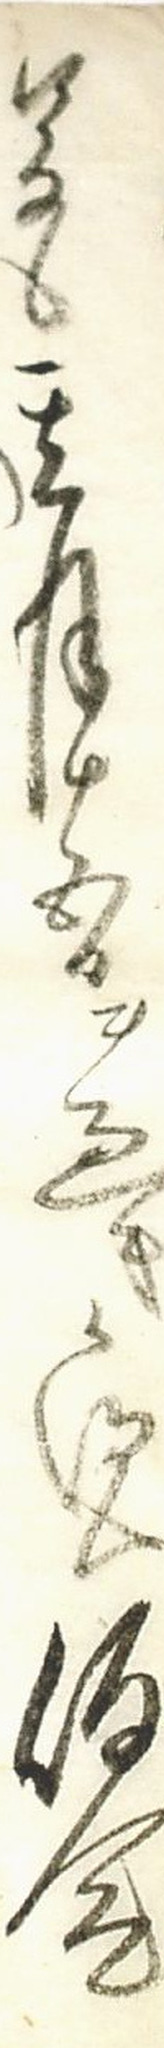候ても其月十五日を過き候得は仮令
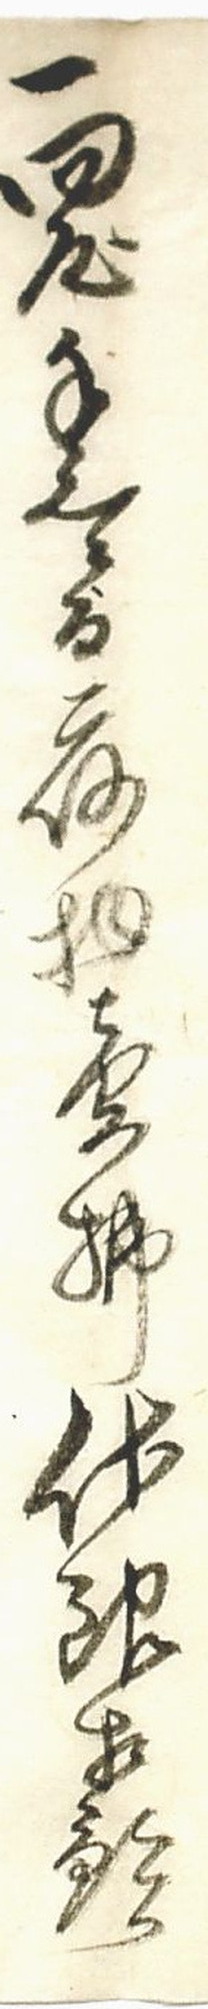一問屋手元にて荷物売払代銀相預
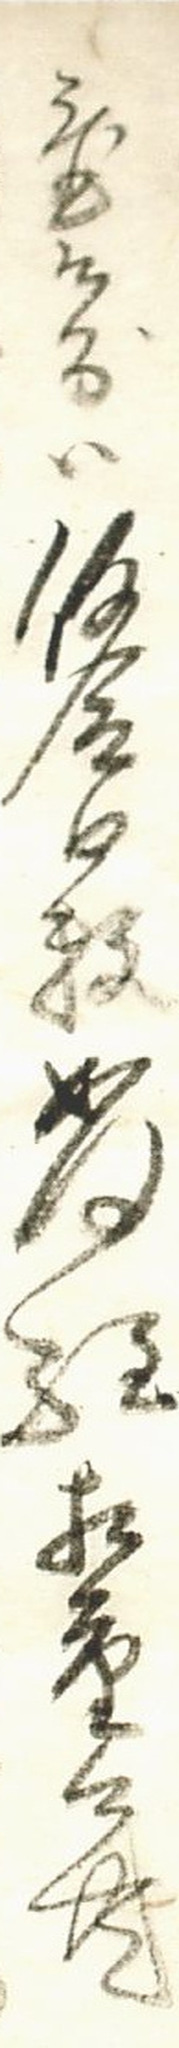置候分は仮令日数如何程相重候共
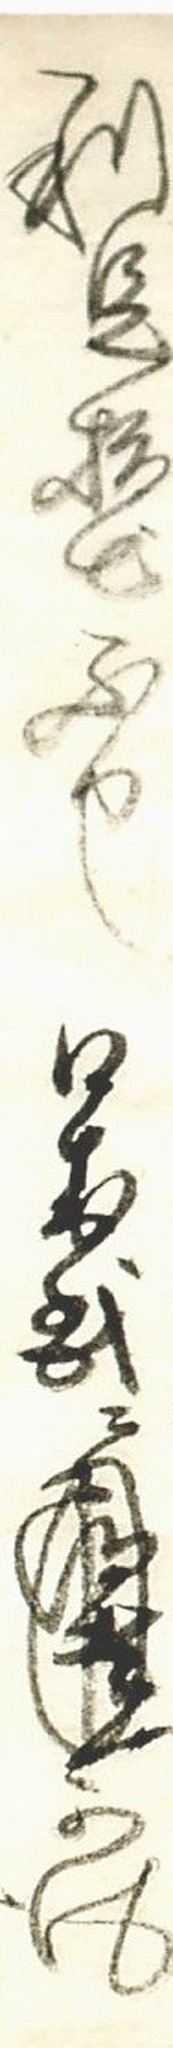利足指出不申日歩当に可仕
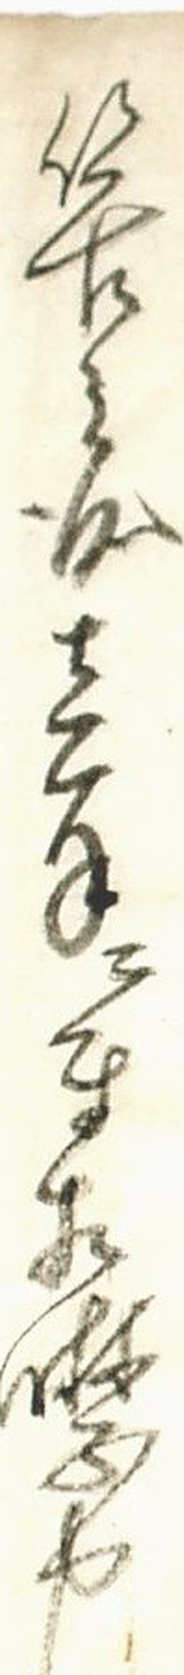筈之所壱手に付相噤申候
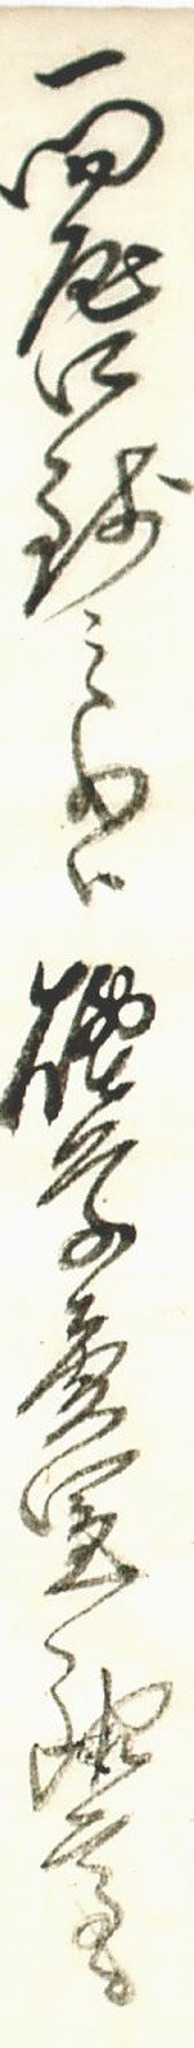一問屋口銭之義は煙草売買銀高に
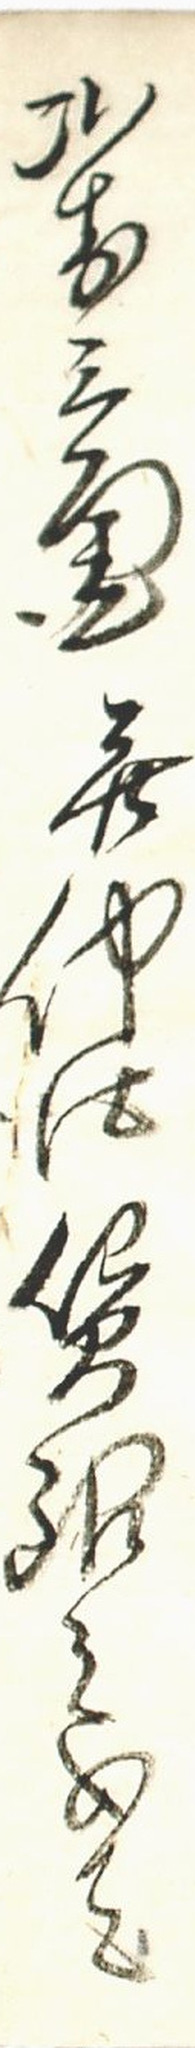弐歩三厘并仲仕賃銀之義は
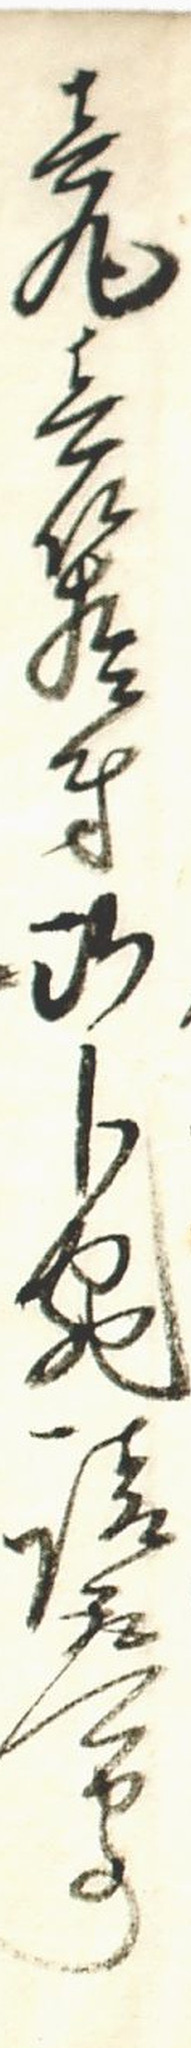壱丸壱箱に付弐分宛請取可申事
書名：煙草問屋扱方一件他
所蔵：鳴門教育大学 Naruto University of Education
